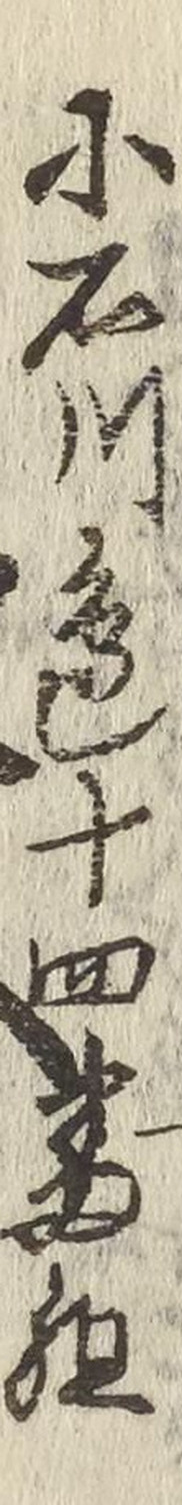小石川辺十四番組
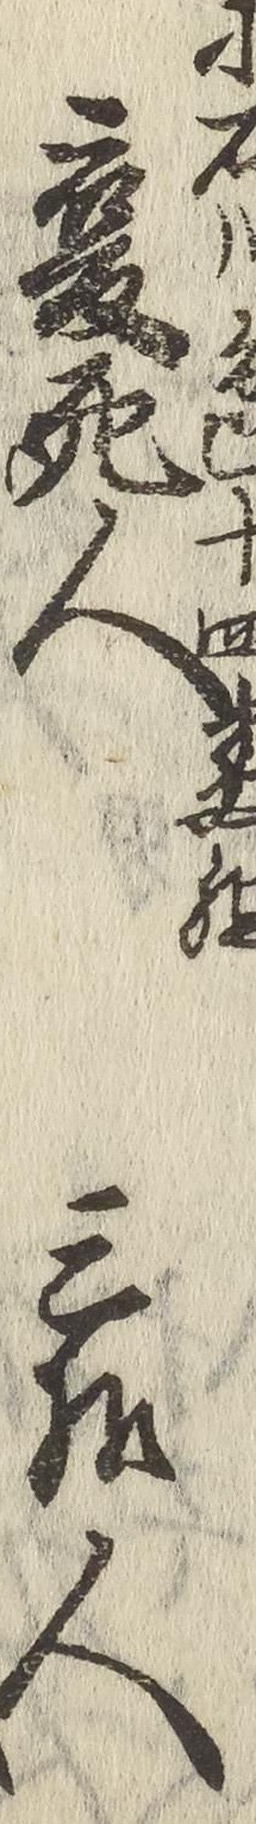変死人三拾人
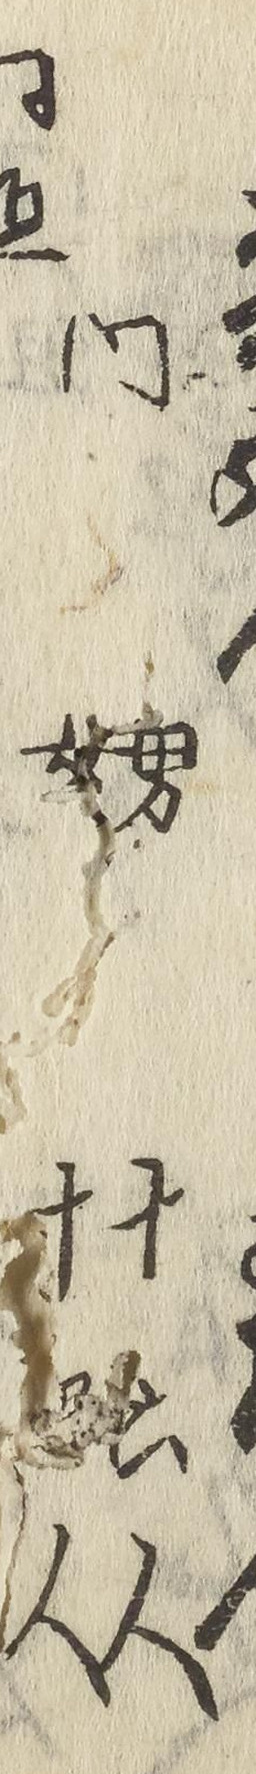内男十六人
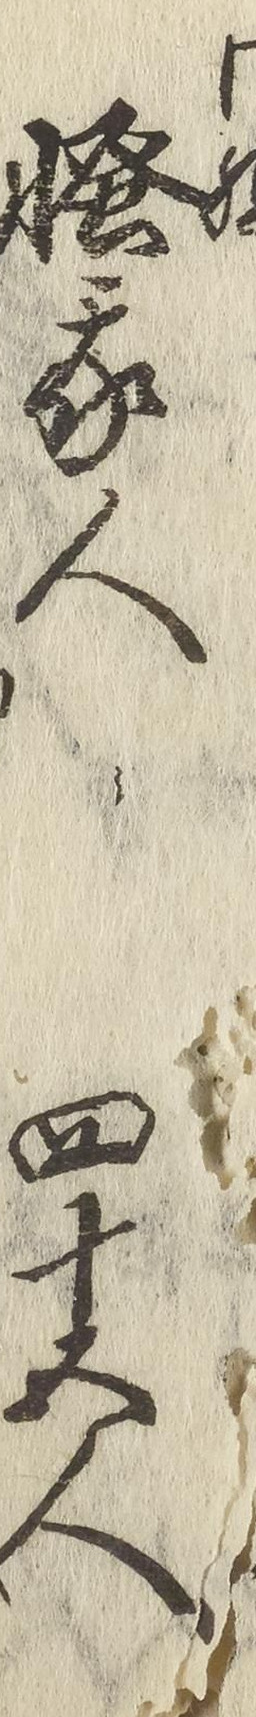怪我人四十五人
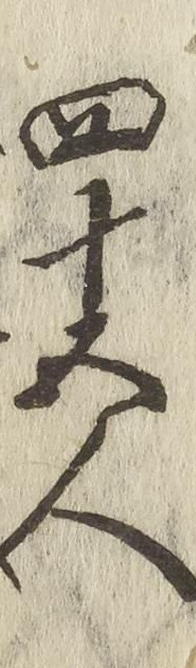女十五人
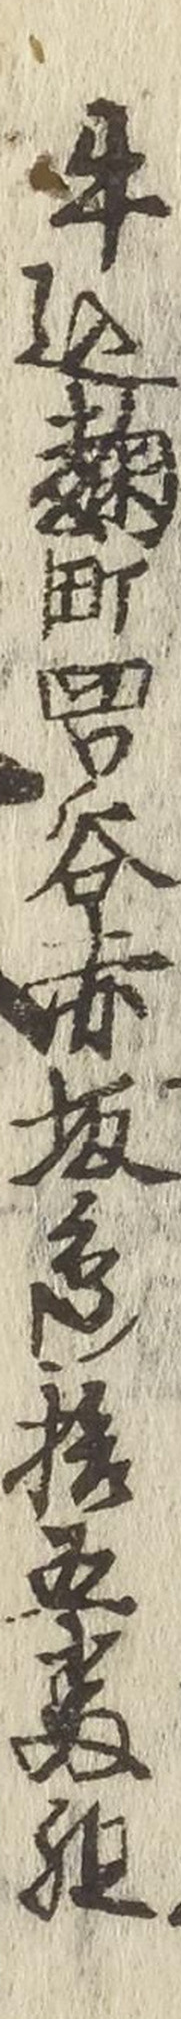牛込麹町四ッ谷赤坂辺拾五番組
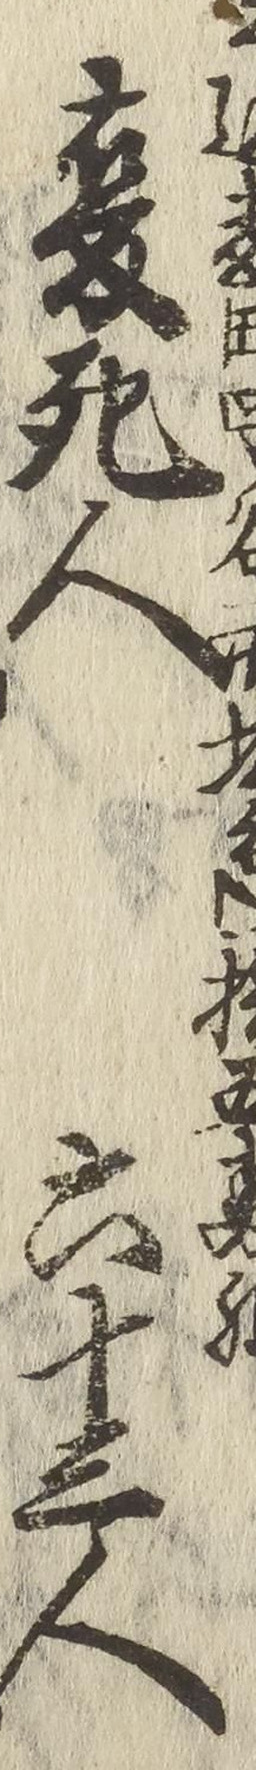変死人六十三人
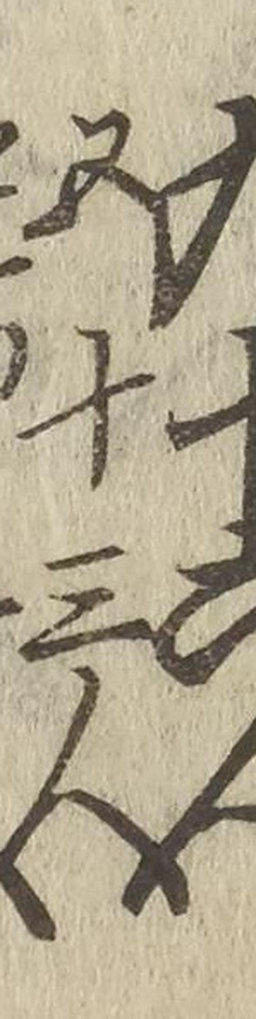内男十三人
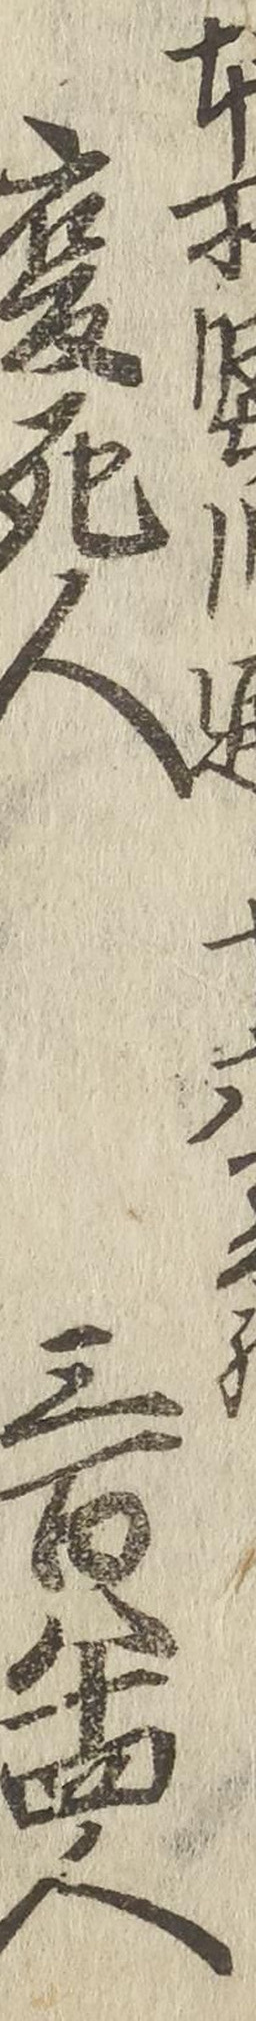変死人三百六十六人

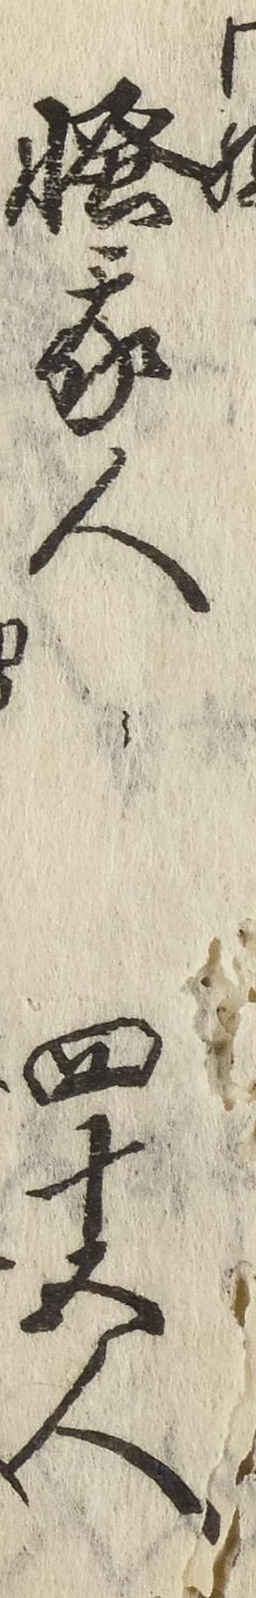怪我人九十六人
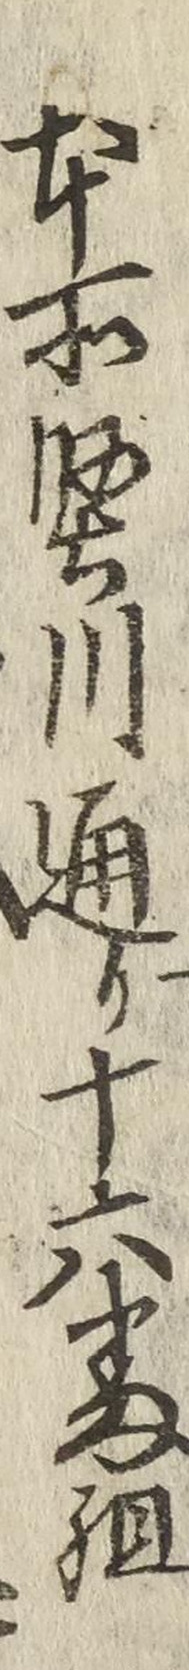本所竪川通り十六番組
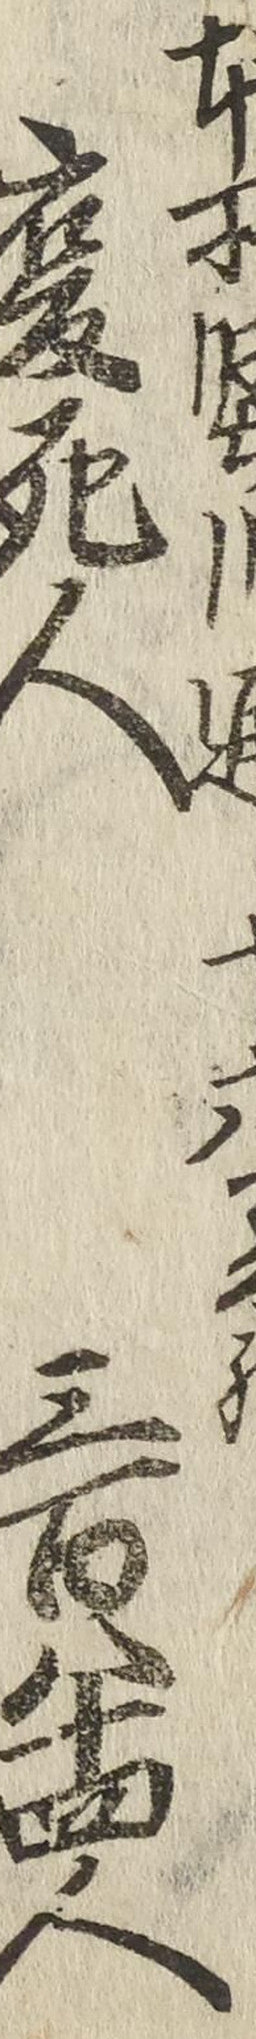変死人三百八十四人
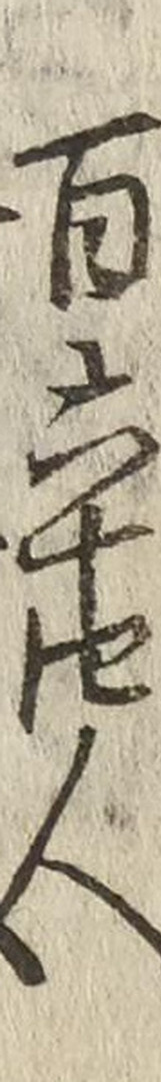内男百六十四人
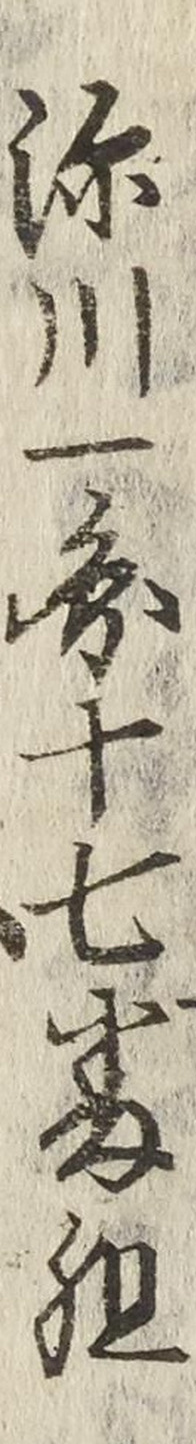深川一円十七番組
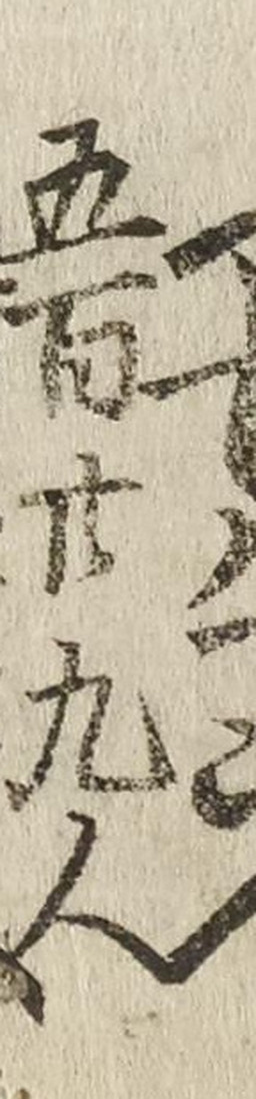内男五百廿九人
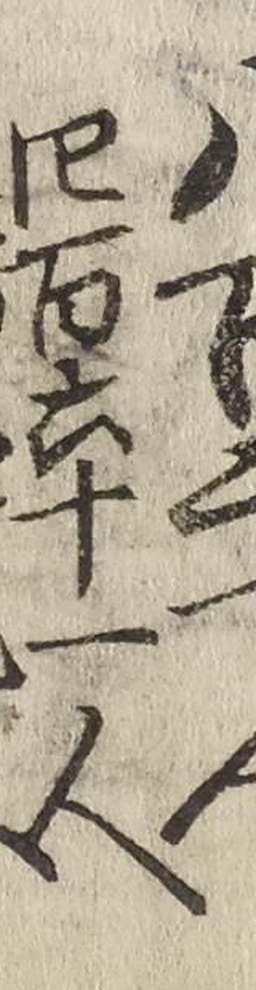内男四百六十一人
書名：地震出火　男女死人怪我人書上之寫
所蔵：東京大学地震研究所図書室 Earthquake Research Institute Library, The University of Tokyo, JAPAN
